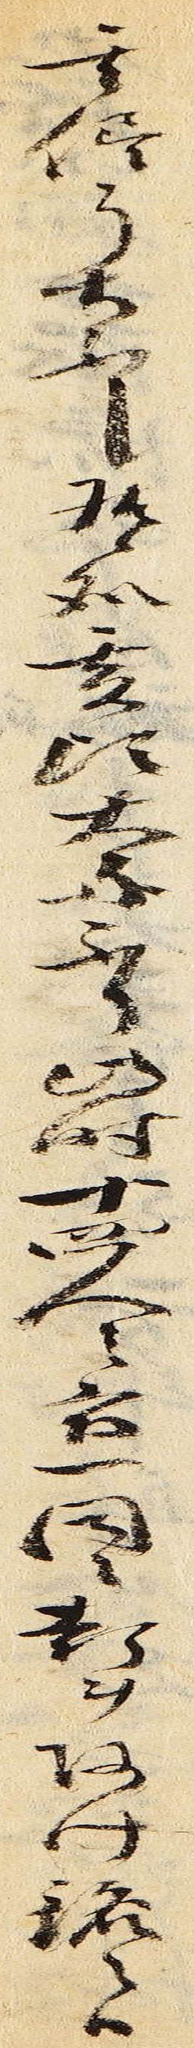其侭うちふし居候処亥頃大雨ふり此時十四人之者一同に声をあけ銘々は
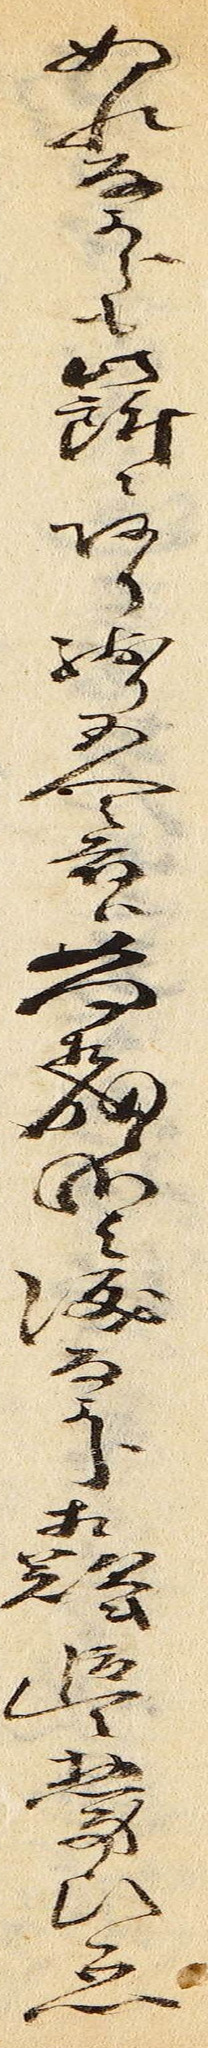ぬれなからも此所にあり残り五人之者は如何相成候哉と涙なから相歎き追々惣身ひゑ
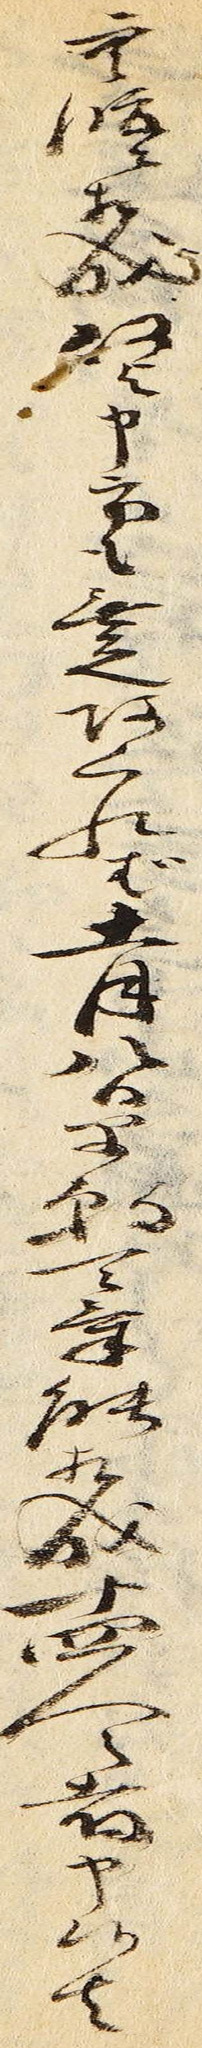空腹に相成何と申方も無之あくれば十一月八日早朝天気能相成十四人之者申候は
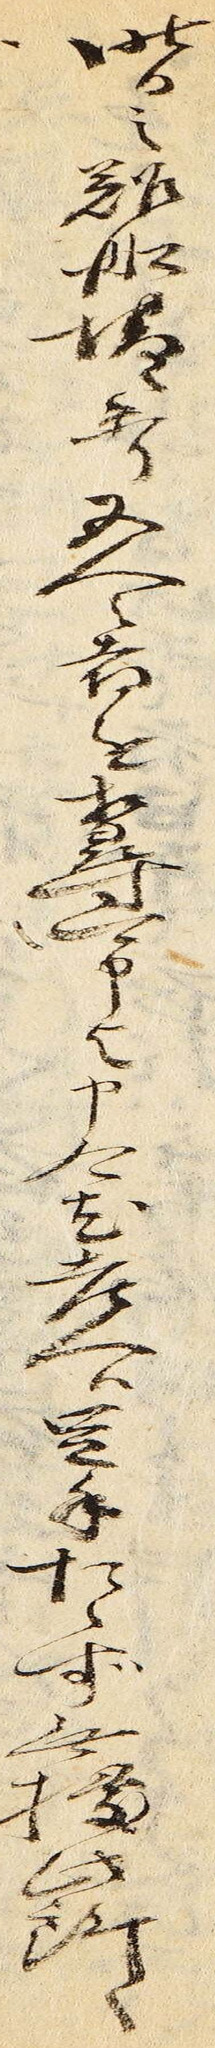昨日之難船場へ参り五人之者を相尋可申と申合尤老人は足手たたず無拠此所へ
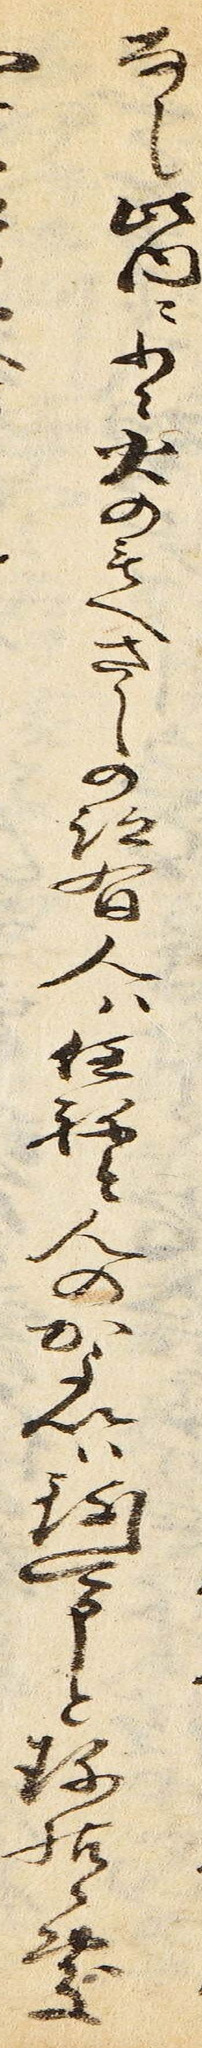なし此内に少々火のもへさしの跡有人は住ねと人のかよいは致し可申と存居候処
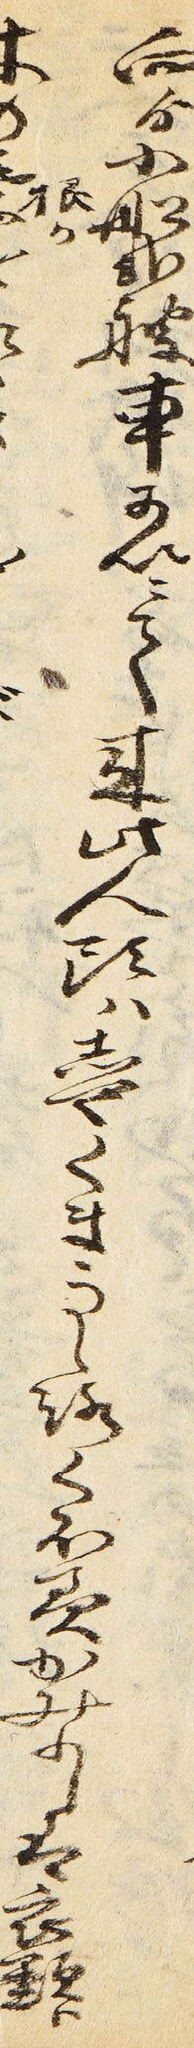向ゟ小船弐艘車かいにて来此人頭はしやくまうしろく不美かみ少しは衣類に
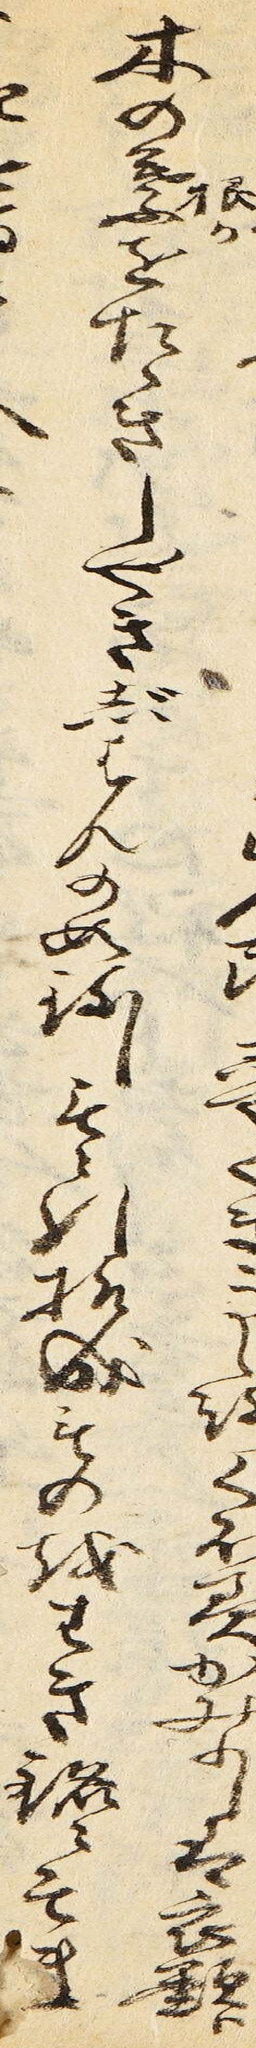木の葉をたたきしやきじはんの如致しもゝ引様成ものをはき銘々そま
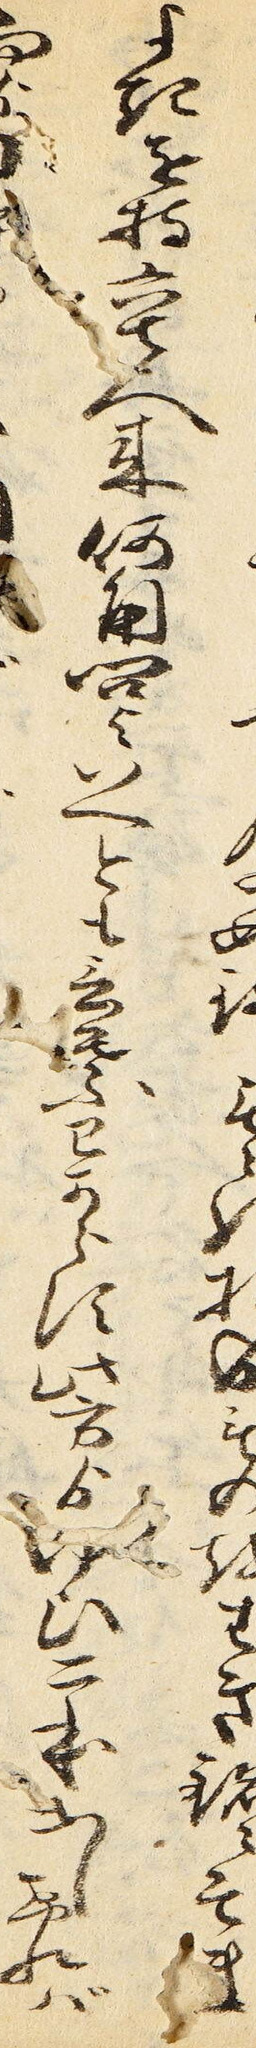よきを持六七人来何角問といへとも言葉わからす此方よりゆひ二本出しければ
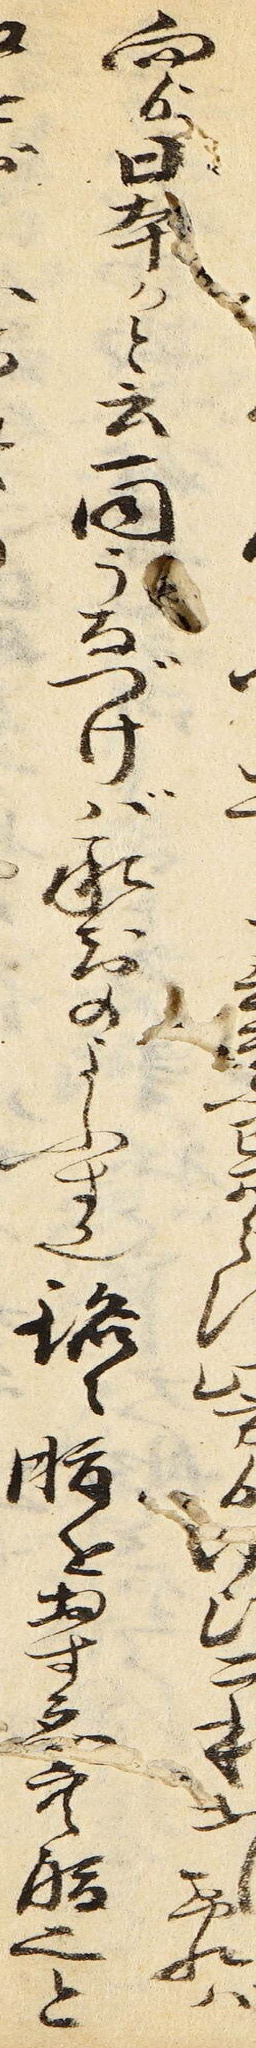向ゟ日本かと云一同うなづけば承知のよふす也銘々腹をおすゑ空腹也と
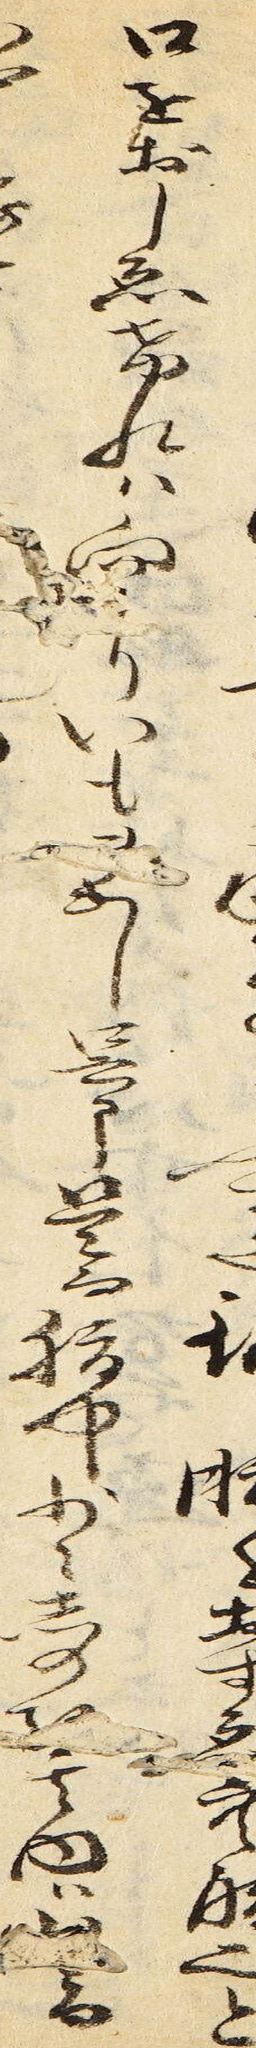口をおしゑけれは向よりいもを出し呉申是而腹中少々しのき其内はに而
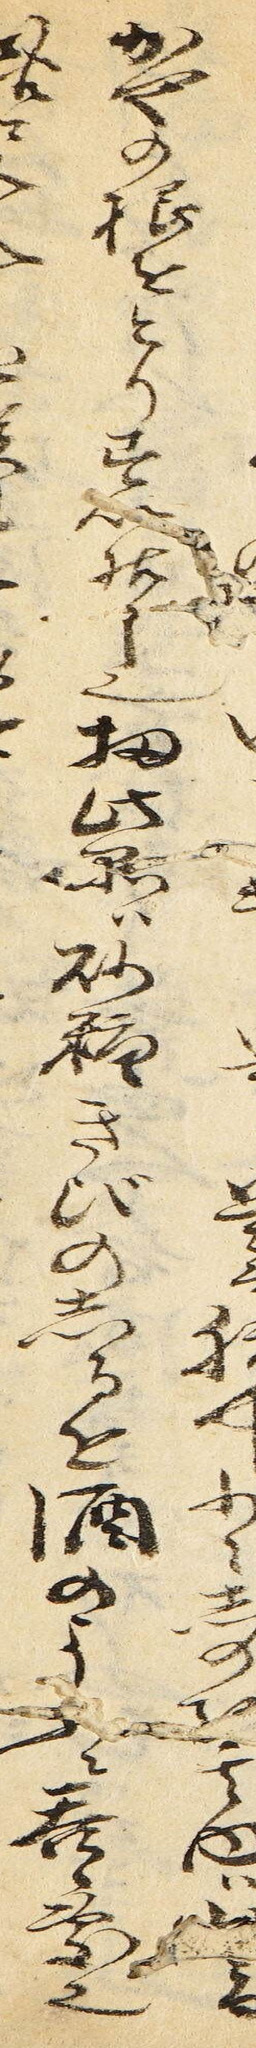かやの根をとりすい居申也扨此品は砂糖きびのしるを酒のよふに呑候処也
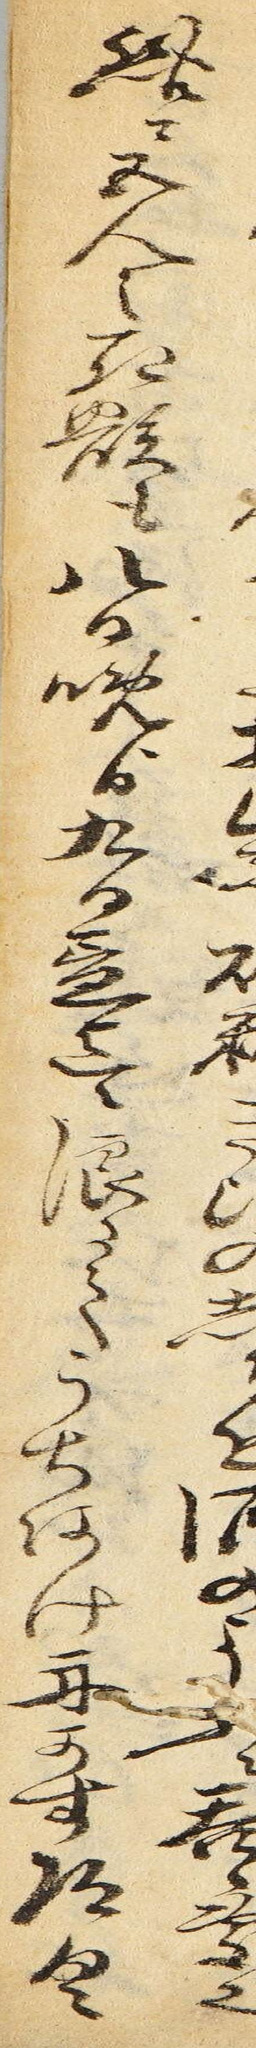然るに五人之死骸も八日晩ゟ九日昼迄に浪にてうちあけ舟かす道具

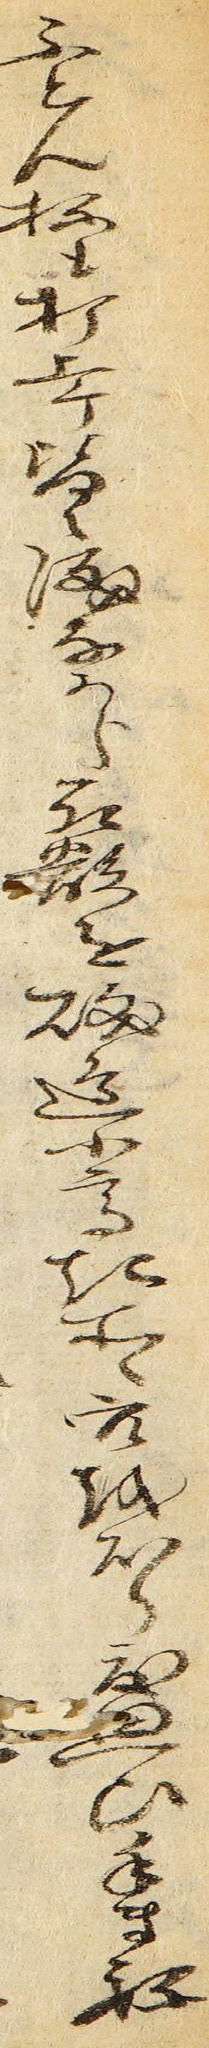ふとん抔も打上け皆々涙なから死骸を磯辺小高き所へ穴をほり度思ひ手まね
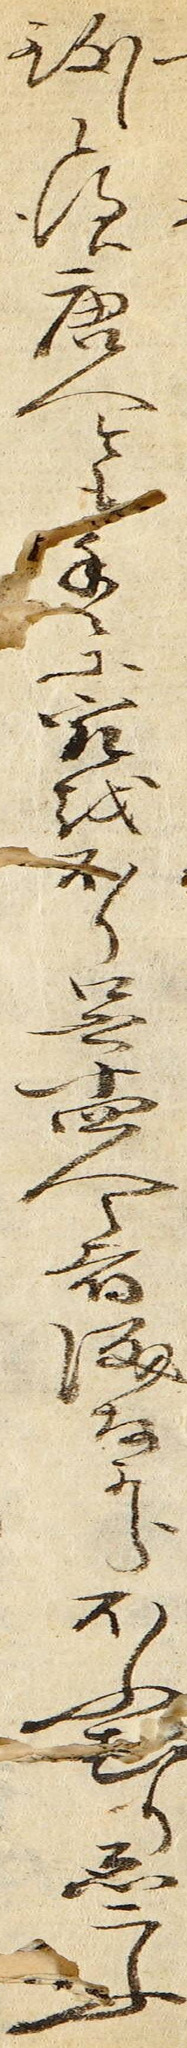致し候得は唐人とも手々に穴をほり呉十四人之者涙なからほふむりゑこふ
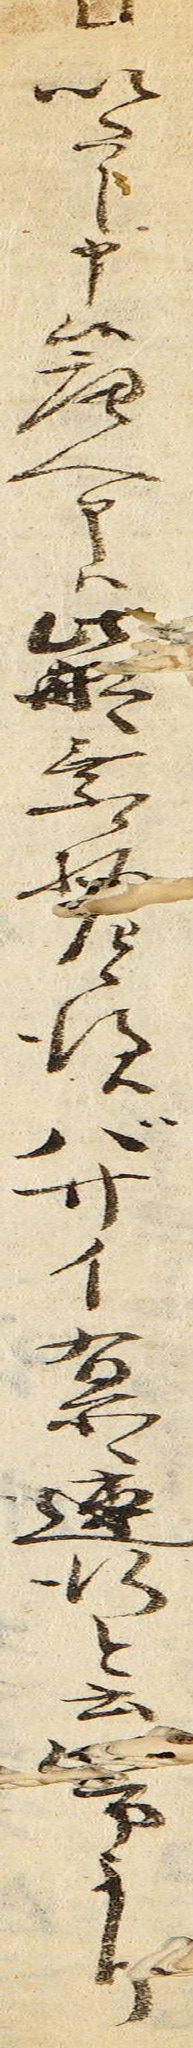いたし申候唐人申は此船へ乗り抔左候得はバサイ有所へ連行と云方より
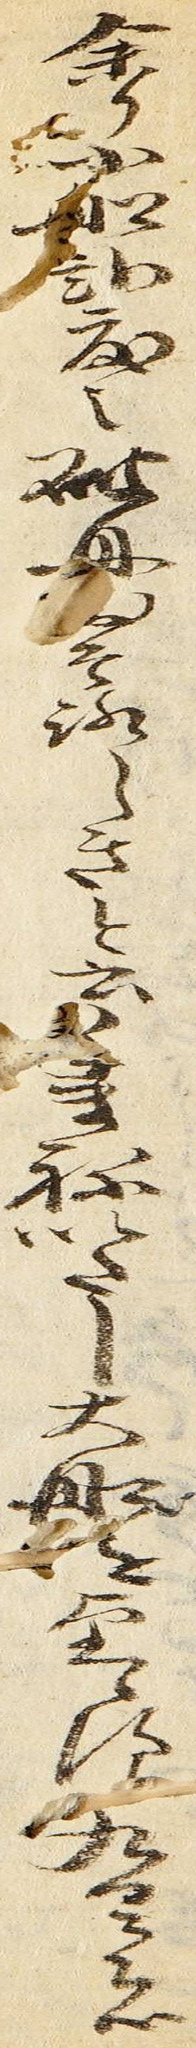余り小船二度之破舟おそろしきと云手まねいたし大船を望候得は九日に者
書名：漂流人物語記
